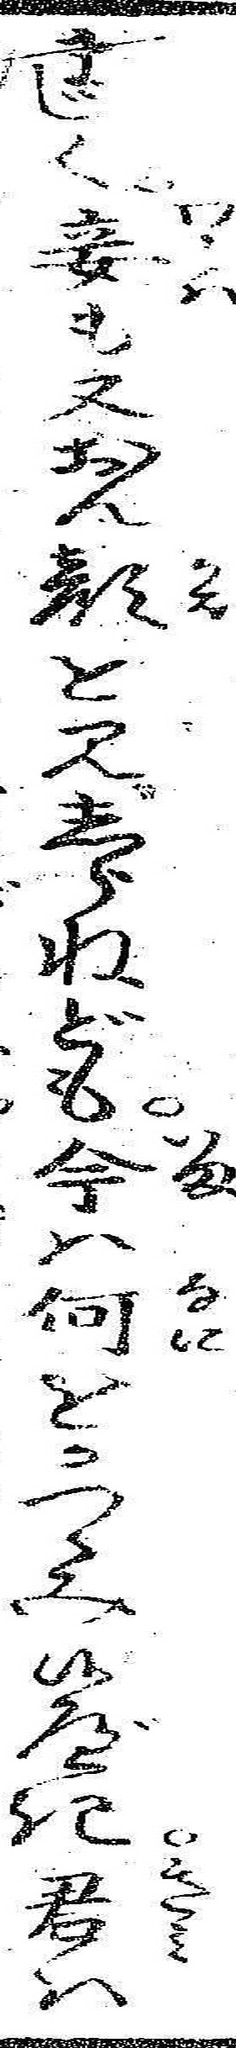まじく。妾も又おん顔を見しらねども。今は何をかつゝみ候べき。君は
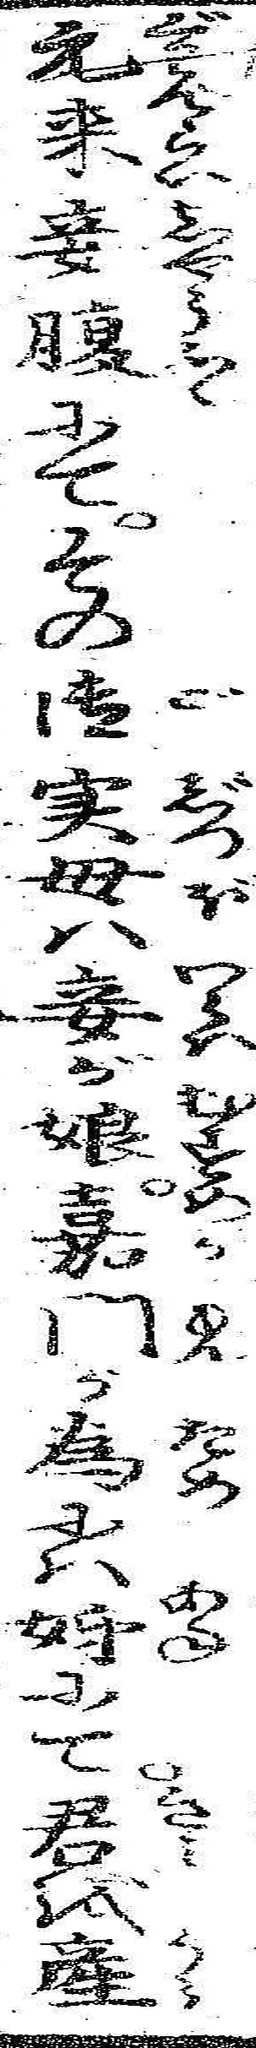元来妾腹にて。その御実母は妾が娘。嘉門が為には姉にて。君を産
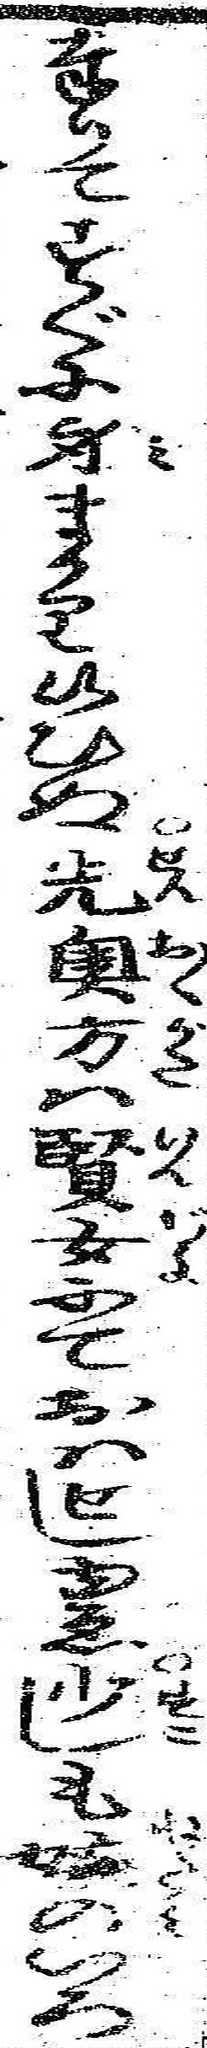奉りてすぐに身まかり候ひぬ。先奥方は賢女にておはせしゆゑ。少しも嫉のいろ
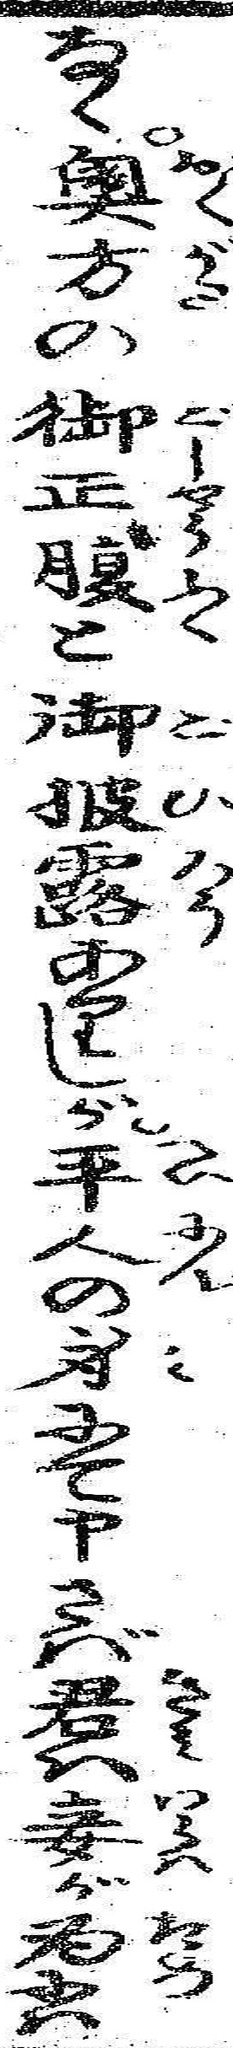なく。奥方の御正腹と御披露ありしが。平人の身にて申さば君は妾が為には
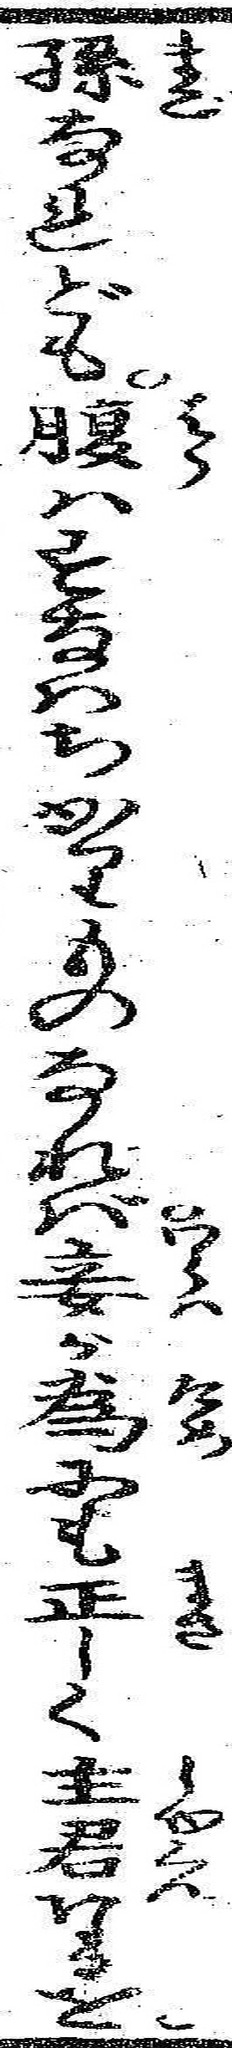孫なれども。腹はすなはちかりものなれば。妾が為にも正しく主君なるを。
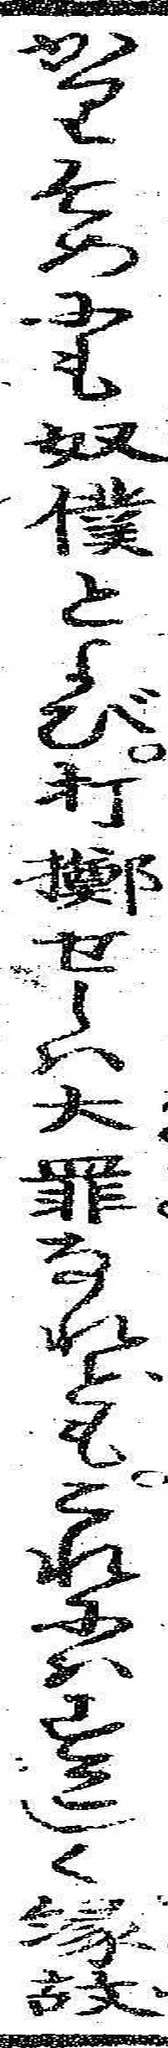かりそめにも奴僕とよび。打擲せしは大罪なれども。これにはすこしく縁故
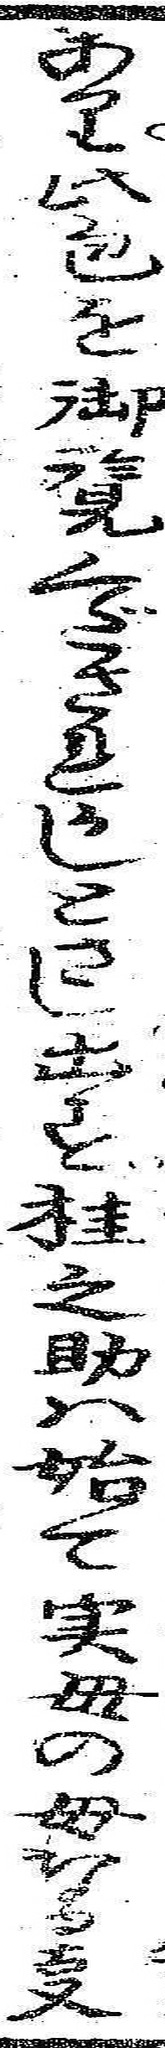あり。此包を御覧くだされかしとさし出す。桂之助は始て実母の母なる事
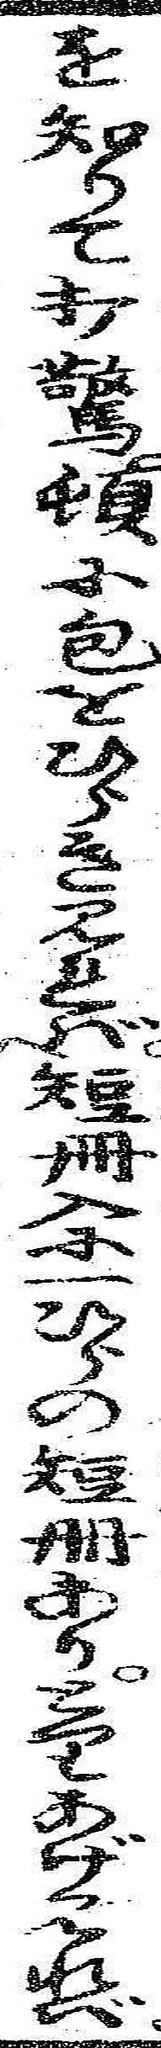を知りて打驚。頓に包をひらき見れば。短冊入に一ひらの短冊あり。とりあげ見れば。
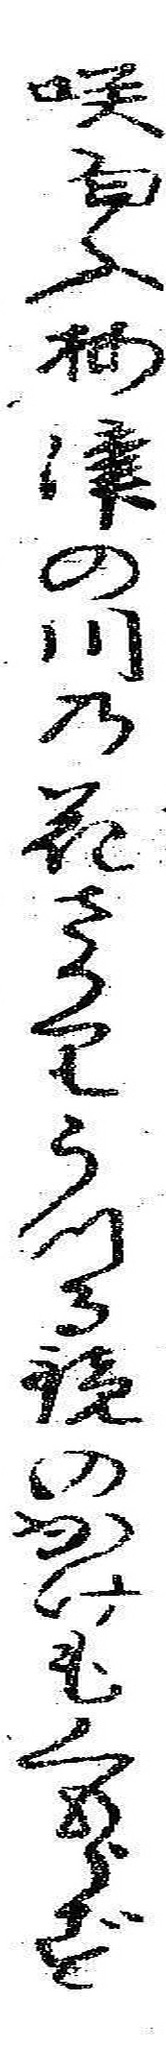咲匂ふ梅津の川の花さかりうつる鏡のかけもくもらず
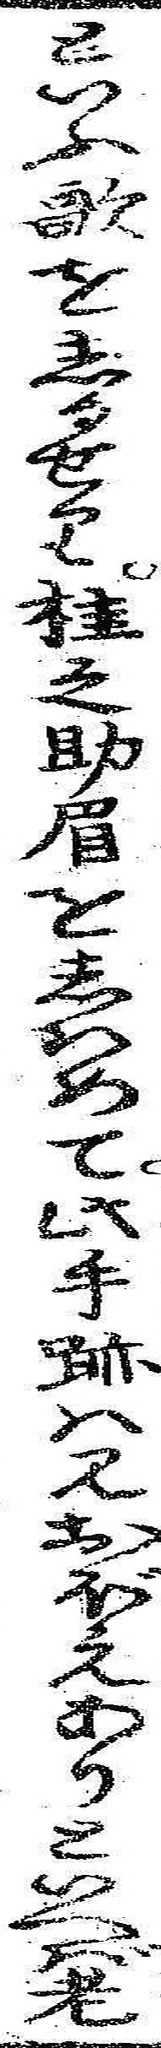といふ歌をしるせり。桂之助眉をしはめて。此手跡は見おぼえありといへば。老
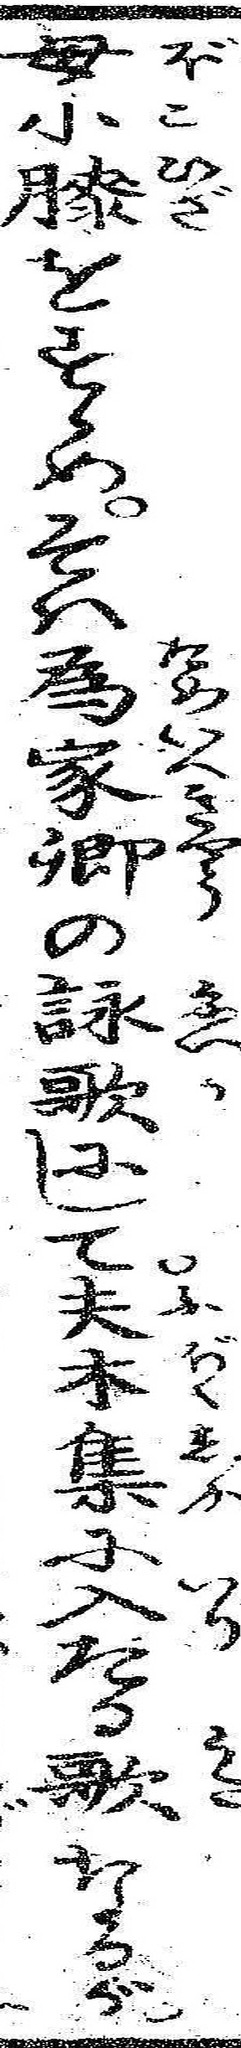母小膝をすゝめ。そは為家卿の詠歌にして。夫木集に入たる歌なるが。
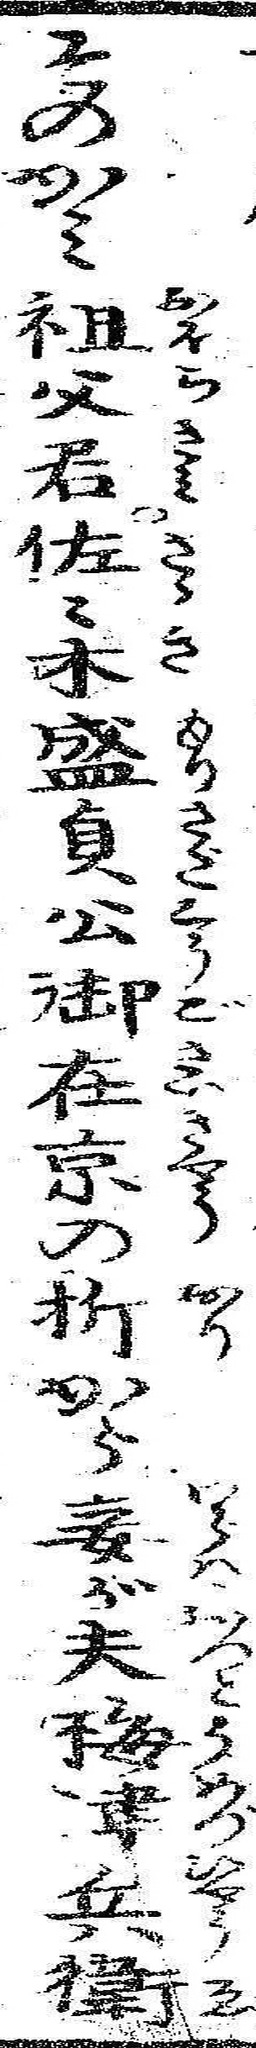そのかみ祖父君。佐々木盛貞公御在京の折から。妾が夫梅津兵衛
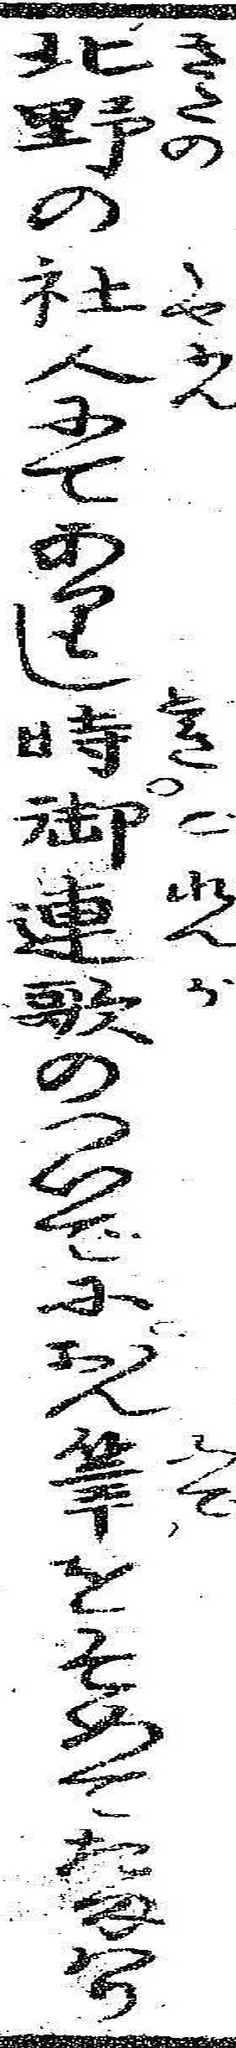北野の社人にてありし時。御連歌のついでに。おん筆をそめてたまはり

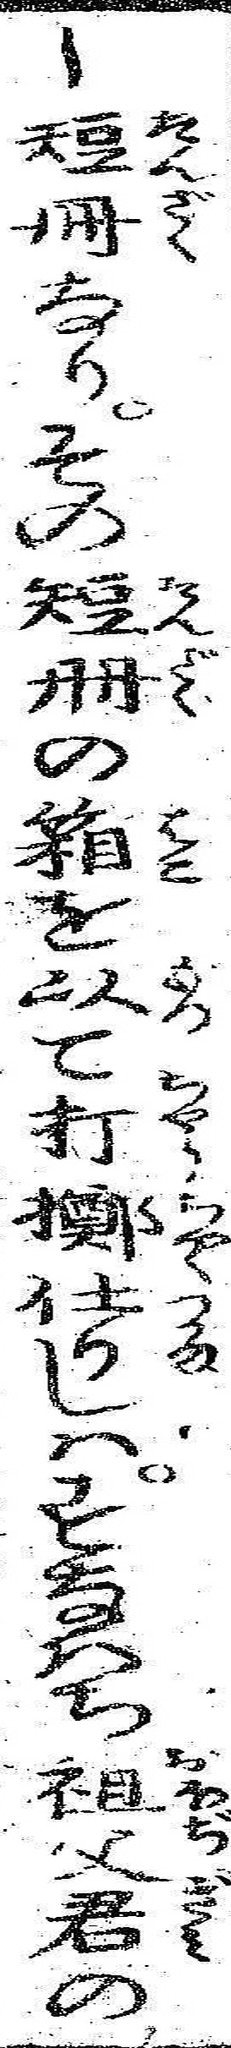し短冊なり。その短冊の箱を以て打擲仕りしは。すなはち祖父君の
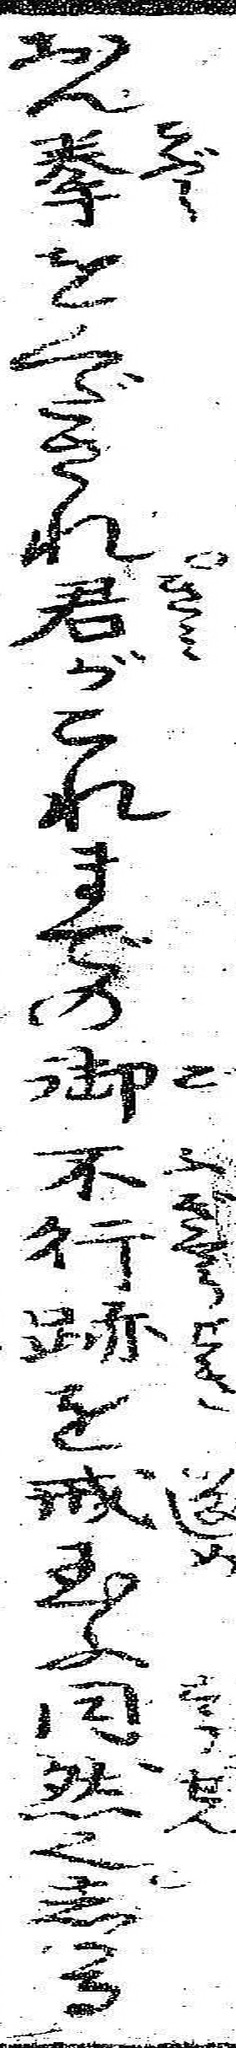おん拳をくだされ。君がこれまでの御不行跡を戒玉ふ同然也。しかる
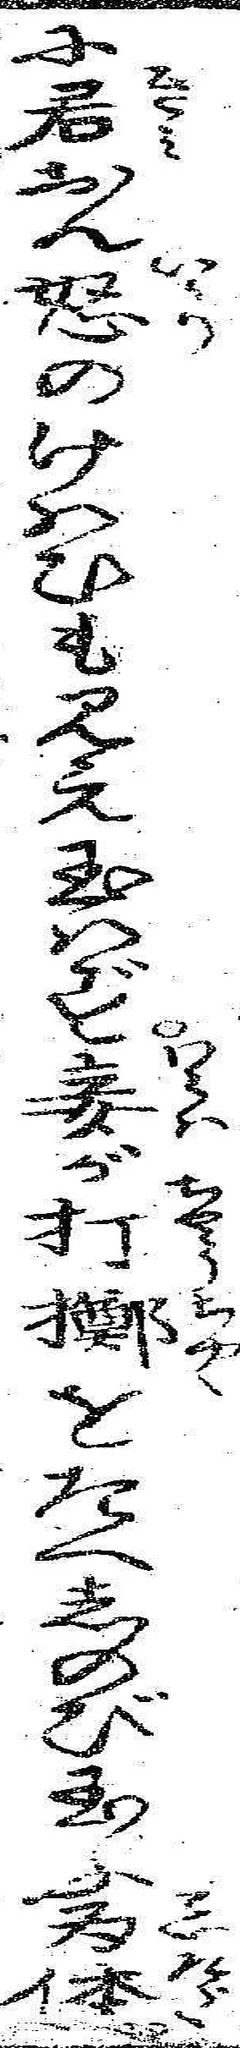に君おん怒のけはひも見え玉はず。妾が打擲をたへしのび玉ふ為体。
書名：昔話稲妻表紙
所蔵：国文学研究資料館
